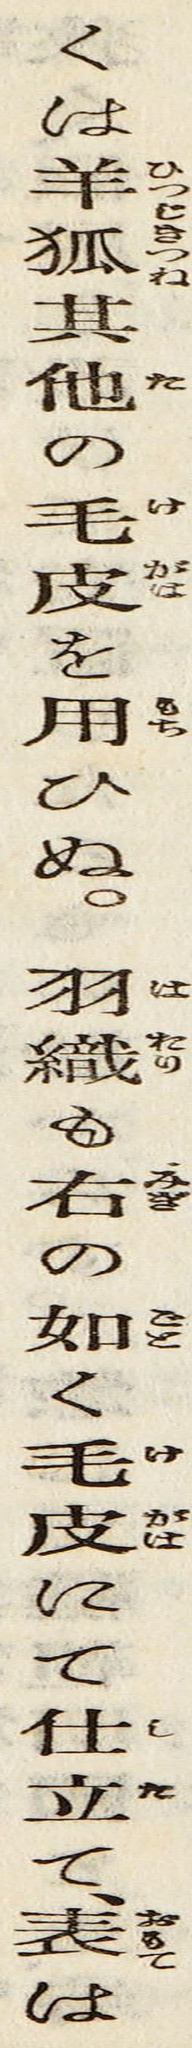くは羊狐其他の毛皮を用ひぬ。羽織も右の如く毛皮にて仕立て、表は
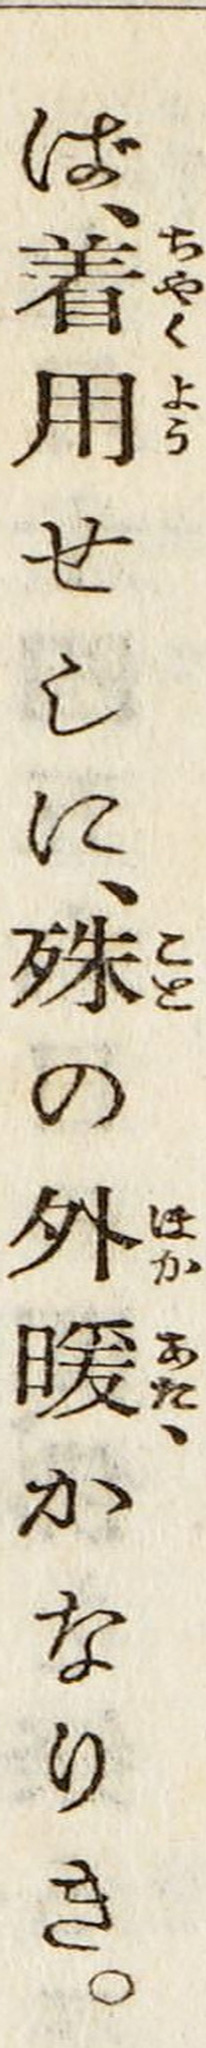ば、着用せしに、殊の外暖かなりき。
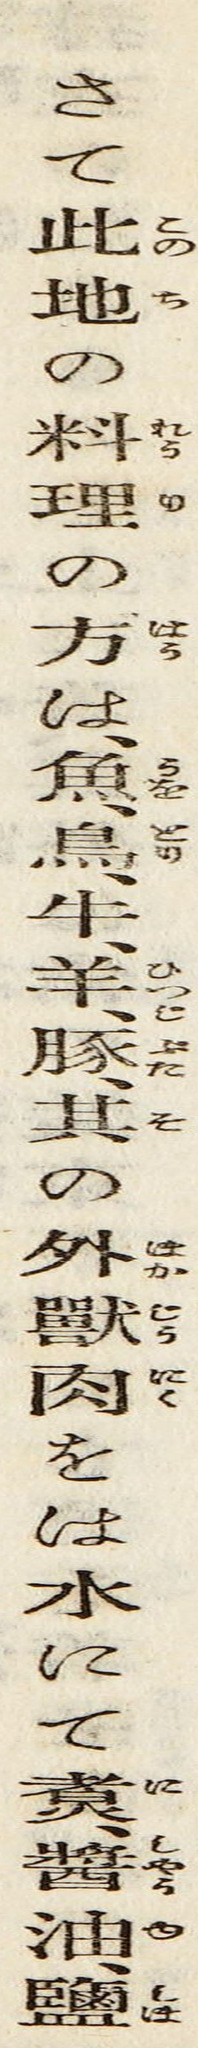さて此地の料理の方は、魚、鳥、牛、羊、豚、其の外獣肉をは水にて煮、醤油、塩
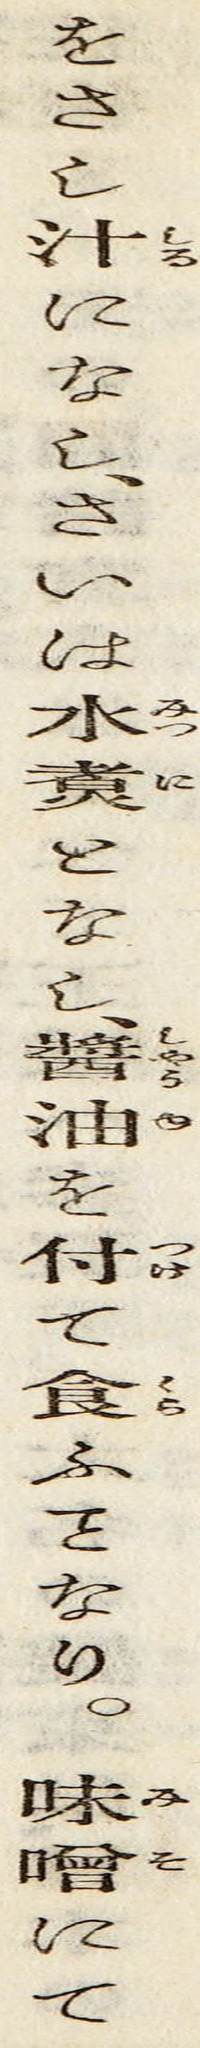をさし汁になし、さいは水煮となし、醤油を付て食ふことなり。味噌にて
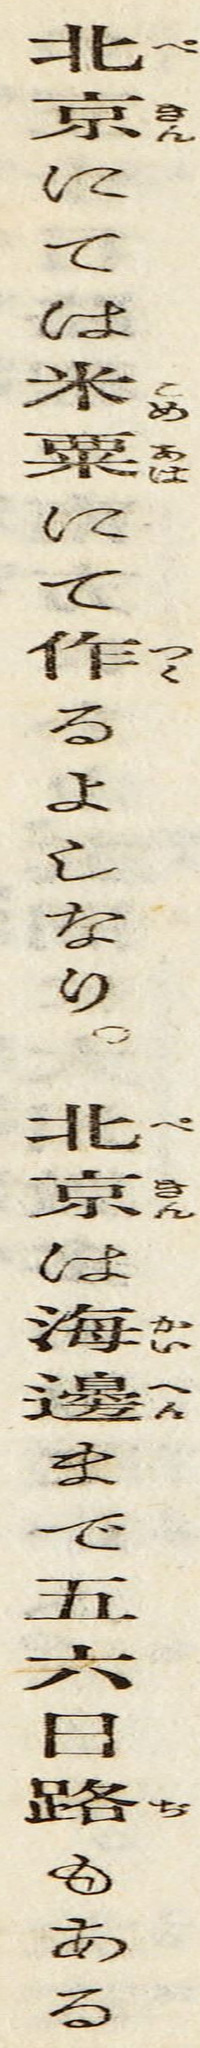北京にては米粟にて作るよしなり。北京は海辺まで五六日路もある
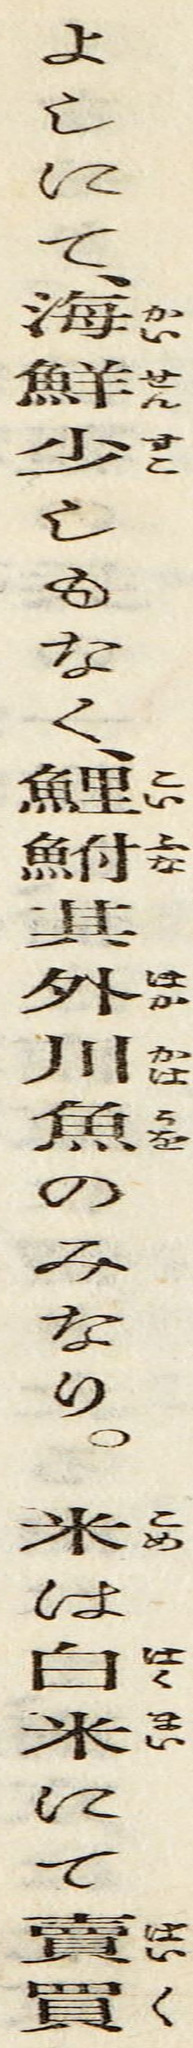よしにて、海鮮少しもなく、鯉鮒其外川魚のみなり。米は白米にて売買
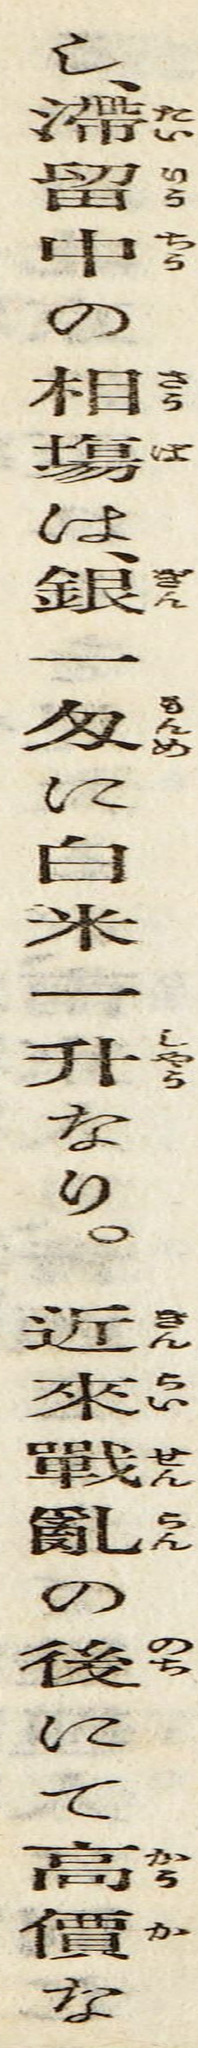し、滞留中の相場は、銀一匁に白米一升なり。近来戦乱の後にて高価な
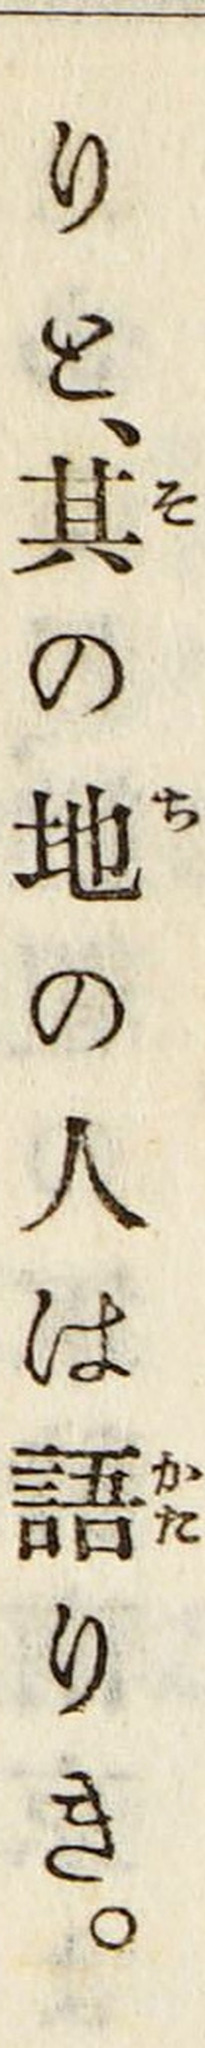りと、其の地の人は語りき。

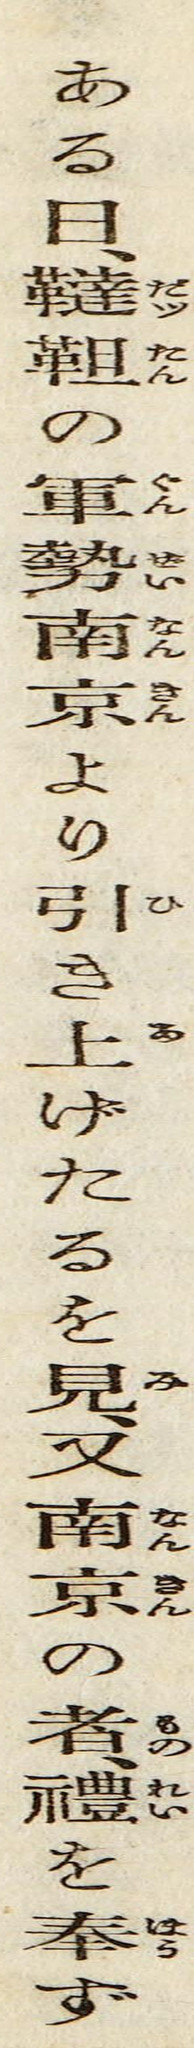ある日、韃靼の軍勢南京より引き上げたるを見、又南京の者、礼を奉ず
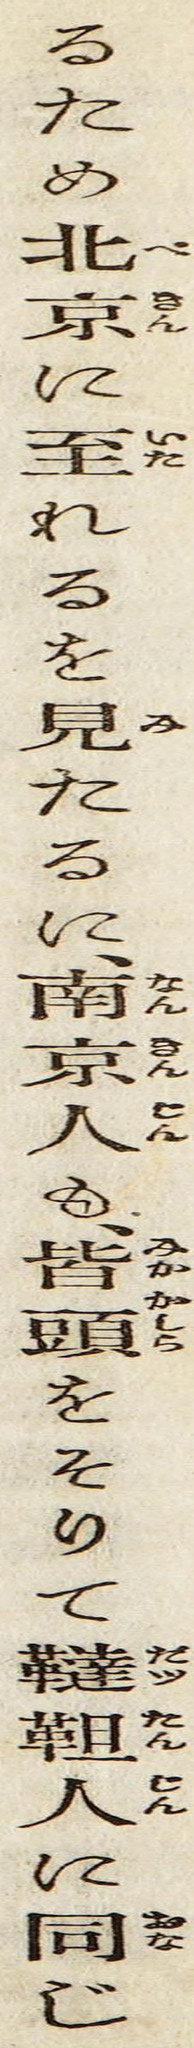るため北京に至れるを見たるに、南京人も、皆頭をそりて韃靼人に同じ
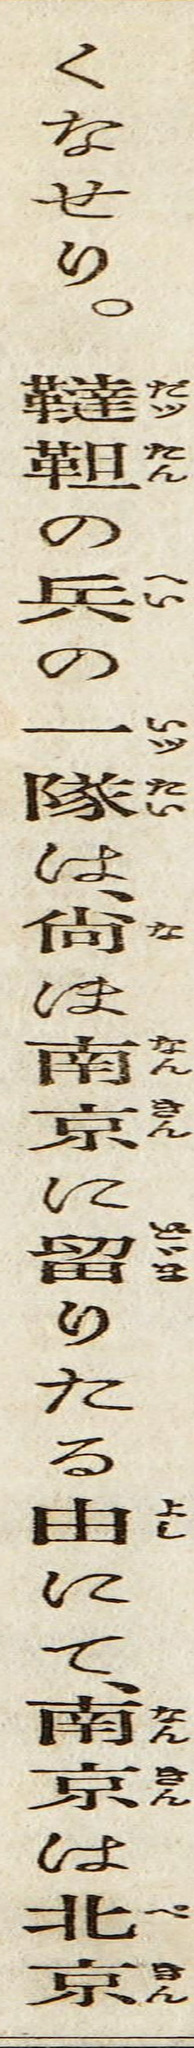くなせり。韃靼の兵の一隊は、尚ほ南京に留りたる由にて、南京は北京
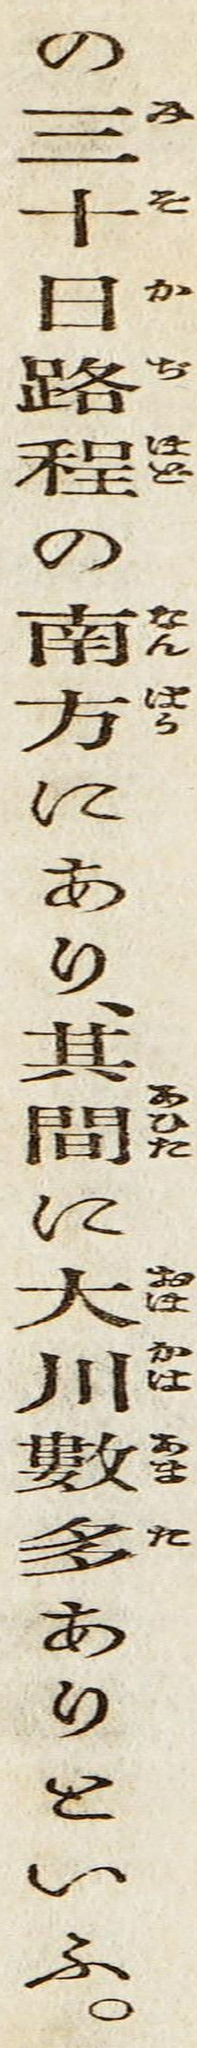の三十日路程の南方にあり、其間に大川数多ありといふ。
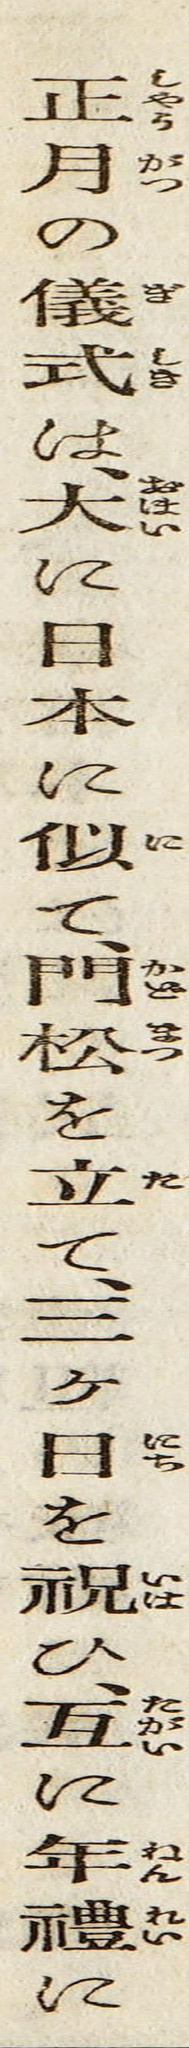正月の儀式は、大に日本に似て、門松を立て、三ヶ日を祝ひ、互に年礼に
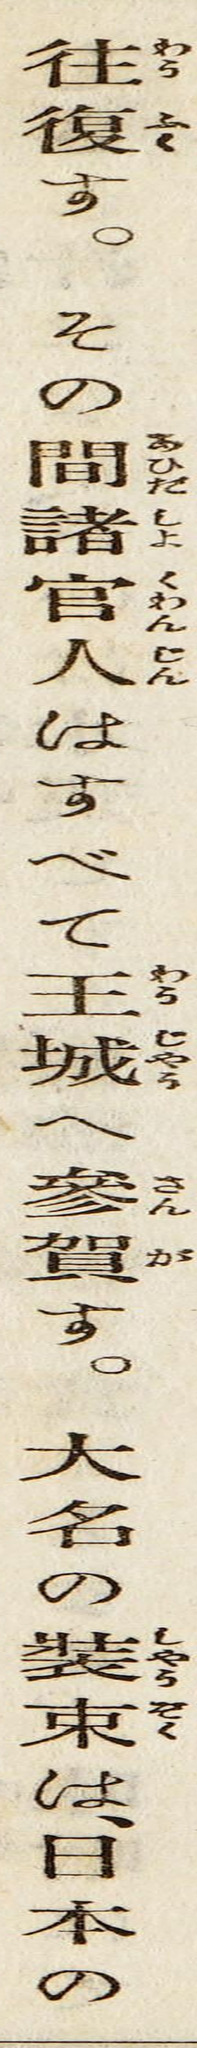往復す。その間諸官人はすべて王城へ参賀す。大名の装束は、日本の
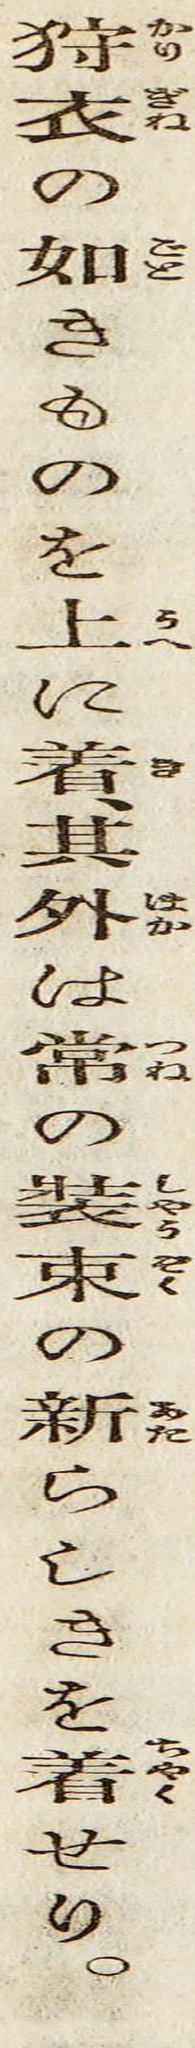狩衣の如きものを上に着、其外は常の装束の新らしきを着せり。
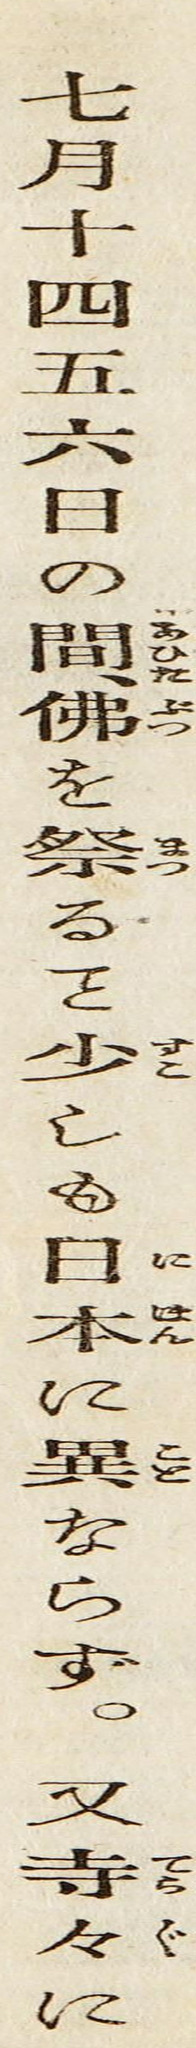七月十四五六日の間、仏を祭ること少しも日本に異ならず。又寺々に
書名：日本漂流譚
